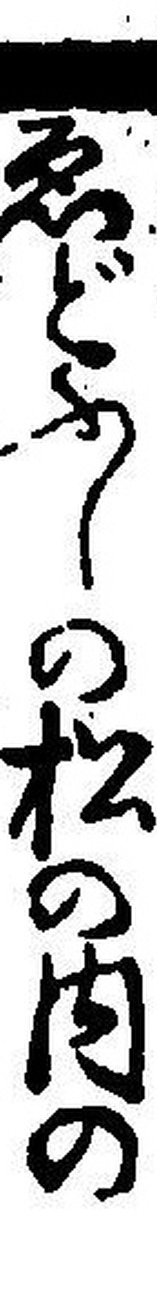ゑどふしの松の内の
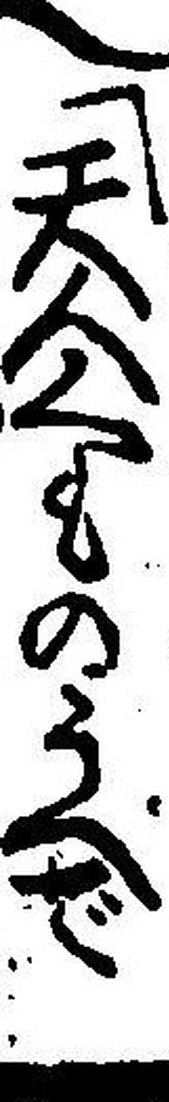〽天人くものうへで
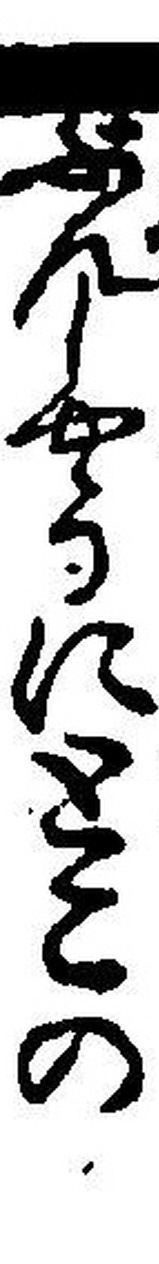ぶんしやうにとこの
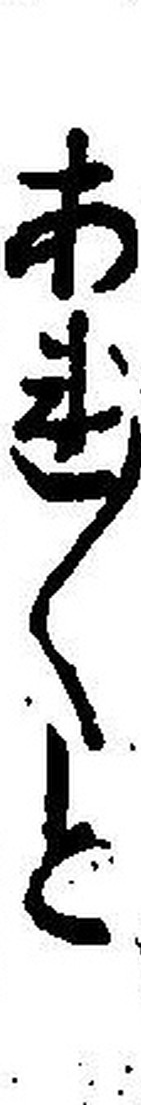あれ〳〵と
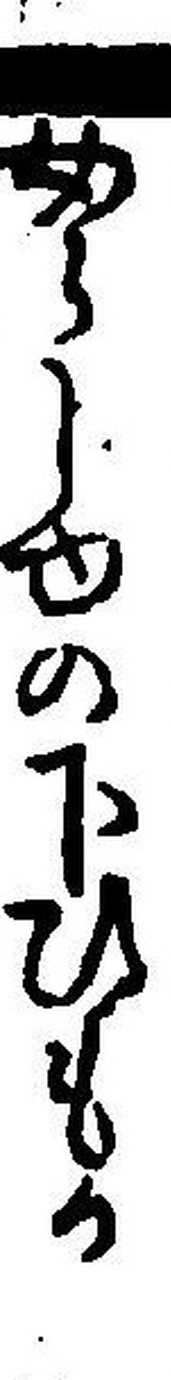女郎しゆの下ひもか
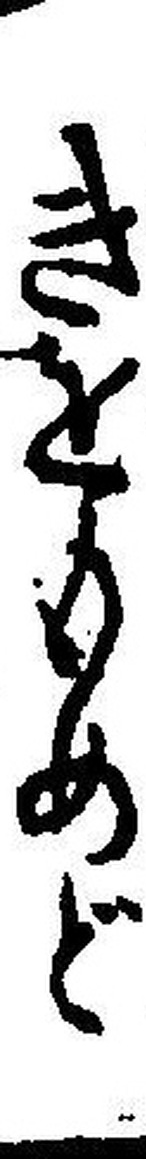きをもめど
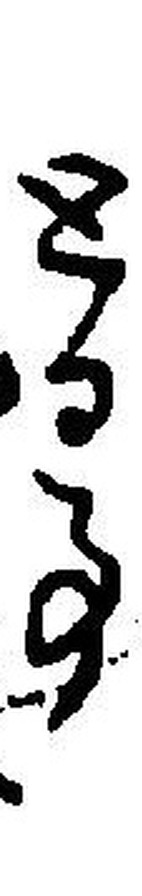とる事
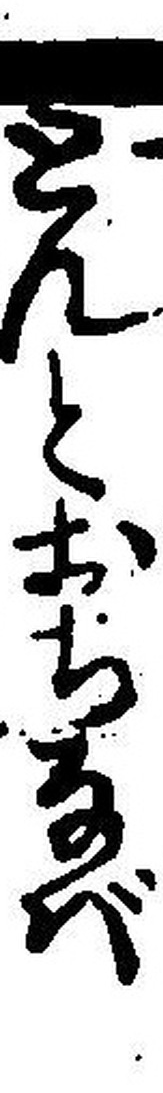とんとおちなば
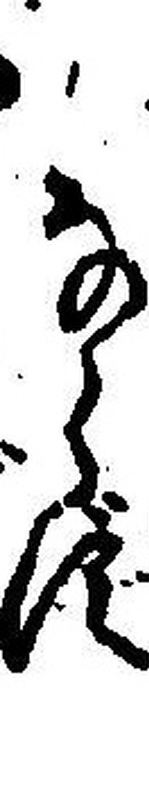ならず
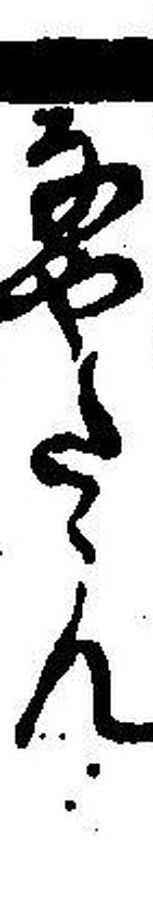なやたゝん
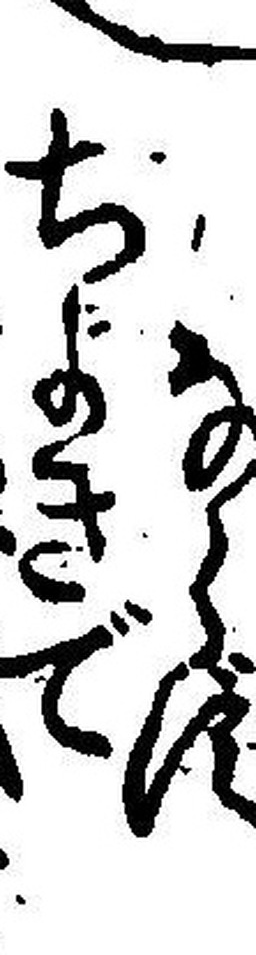ちよきで
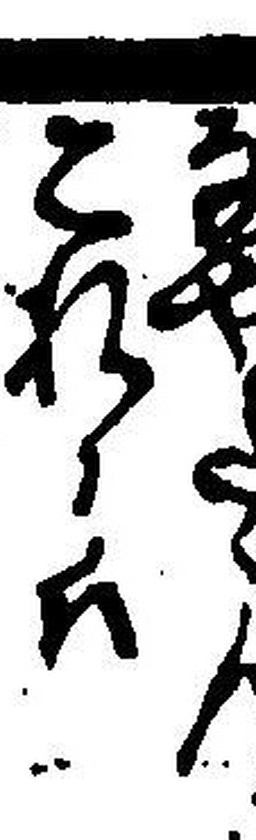これらは
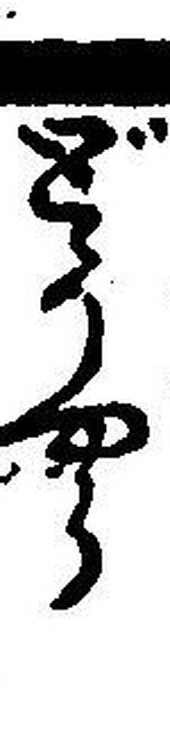どうやら
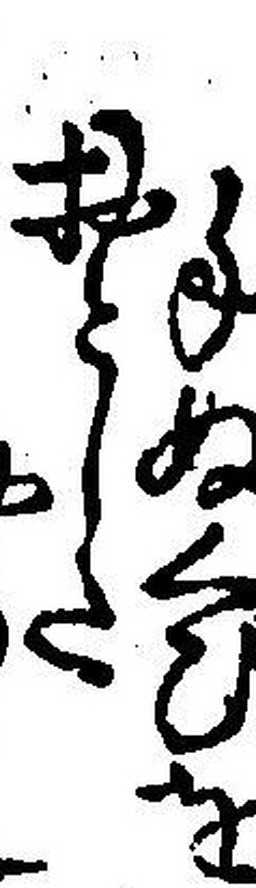おとした
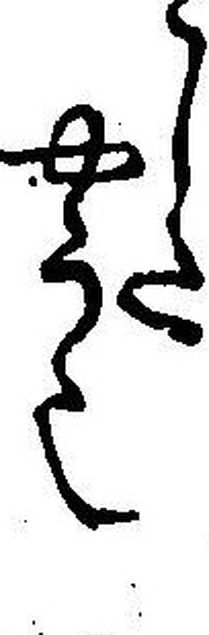やう也
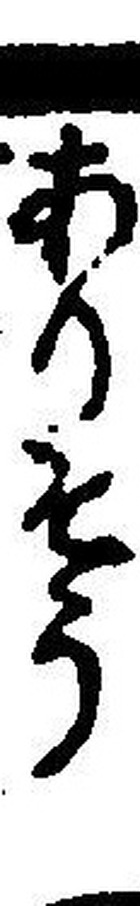ありそう
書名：徳若水縁起金性 / 樹下石上作
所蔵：東京大学総合図書館 General Library in the University of Tokyo, JAPAN
